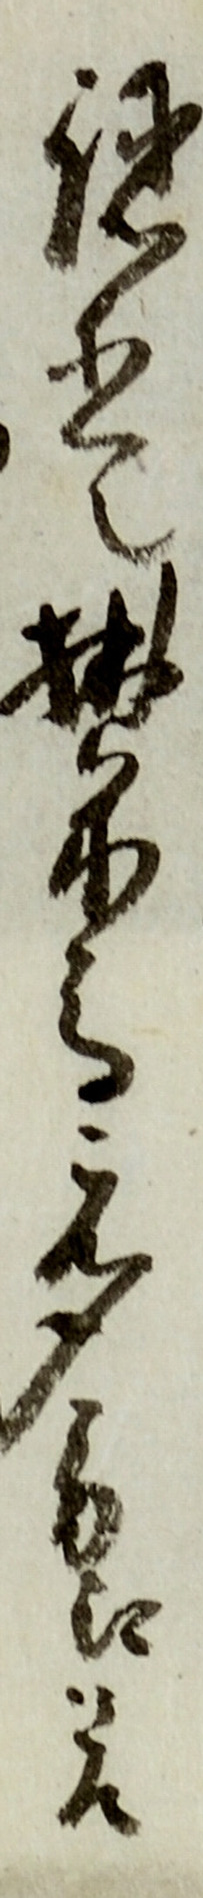認直し払米高元〆方え差
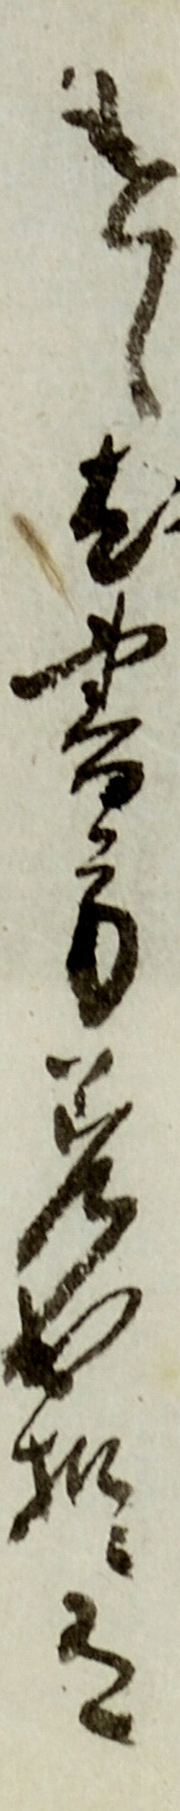遣し候尤書方差出扣に有
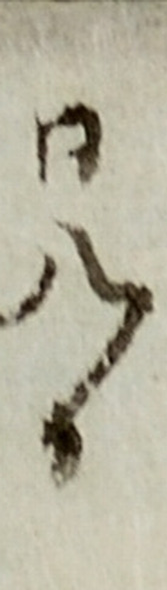同八日
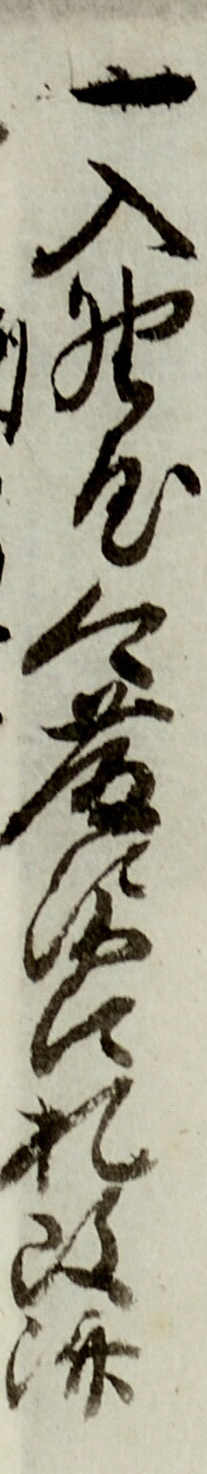一入野屋郷藤沢郷札改済
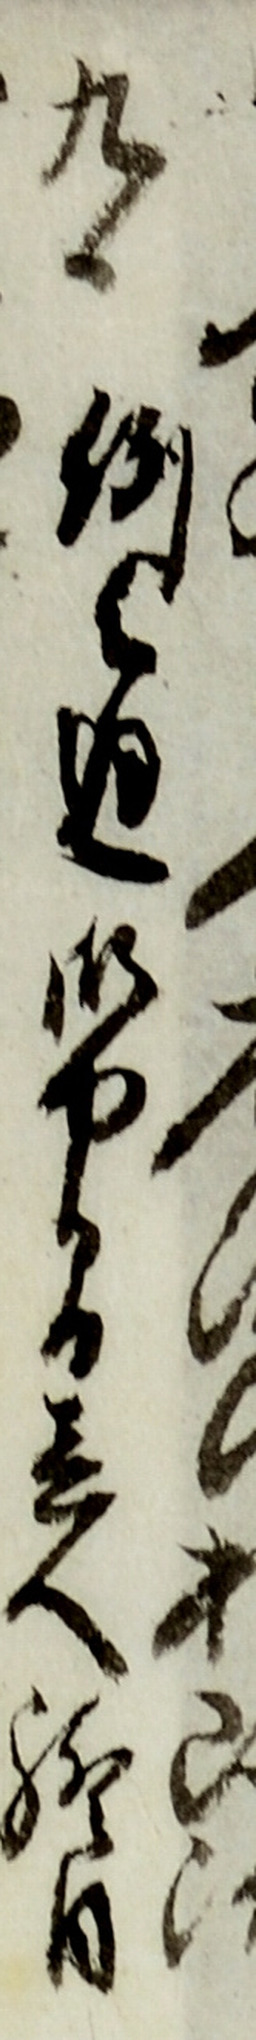九日例之通御中間壱人終日
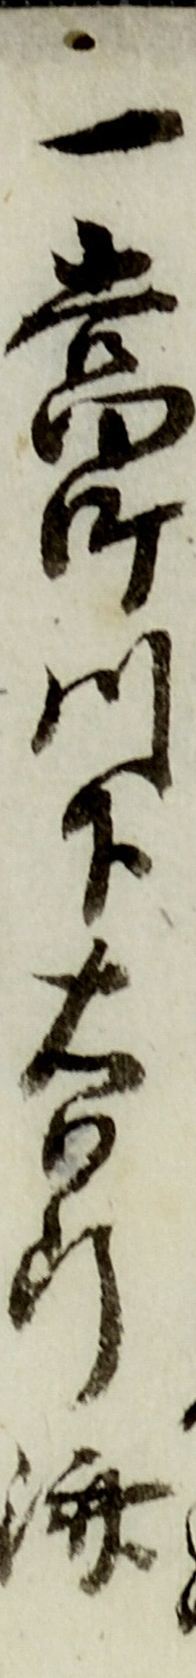一当町川下右同断済
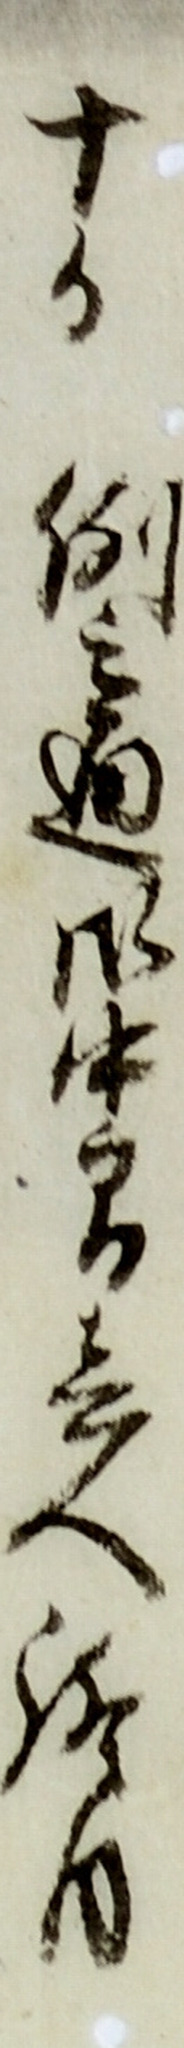十日例之通御中間壱人終日
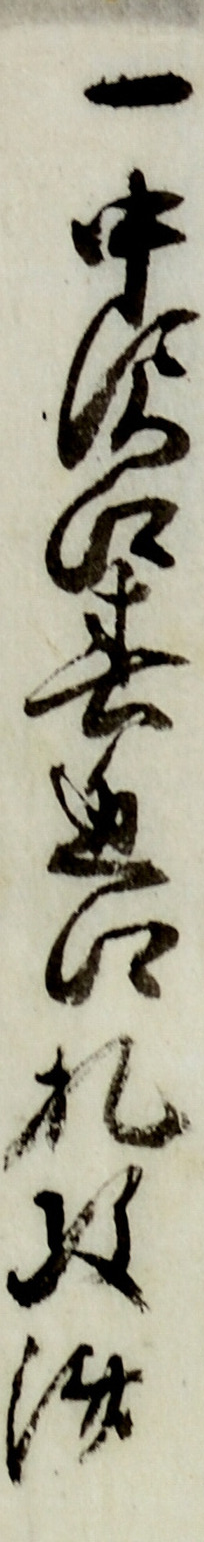一中沢郷春近郷札改済
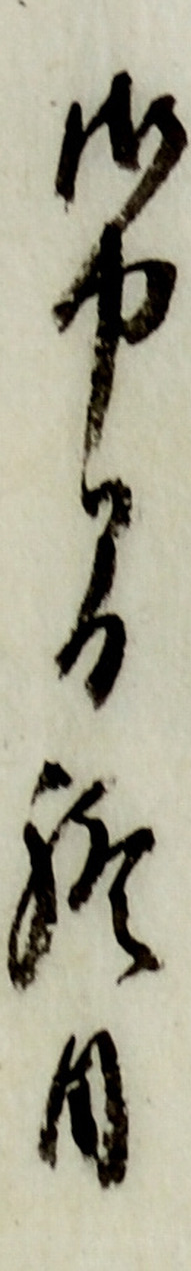御中間終日
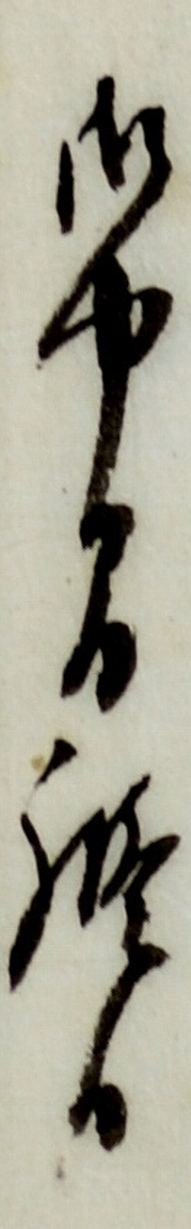御中間終日

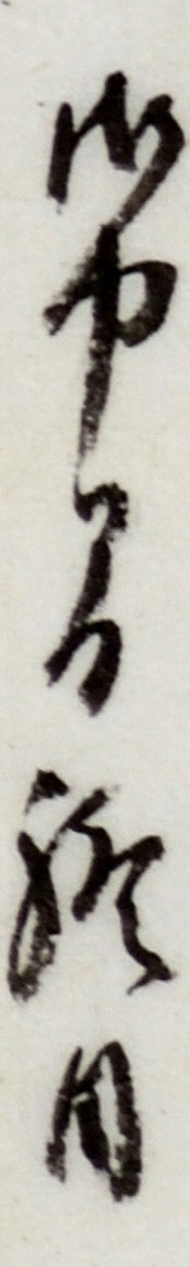御中間終日
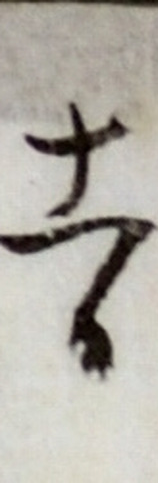十一日
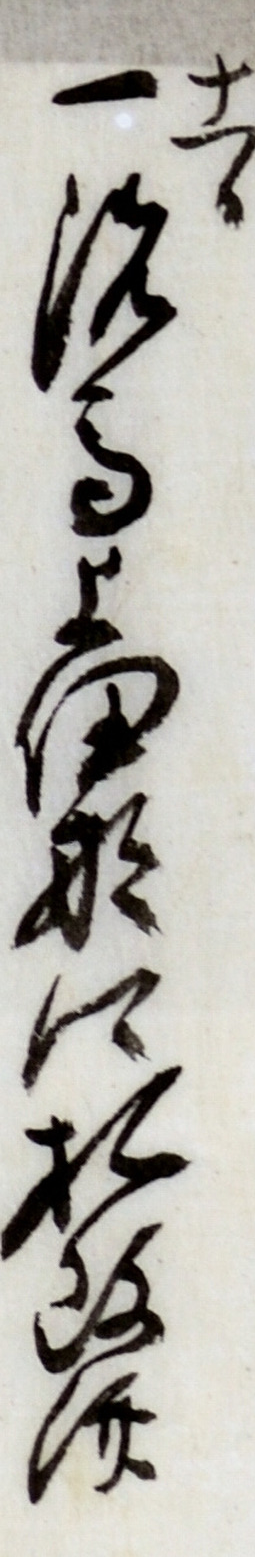一洗馬上伊那郷札改済
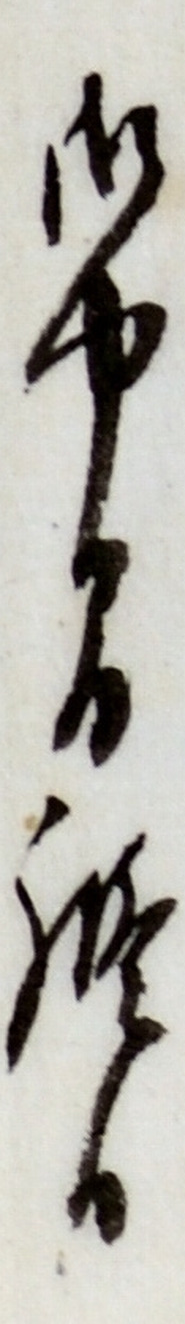御中間終日
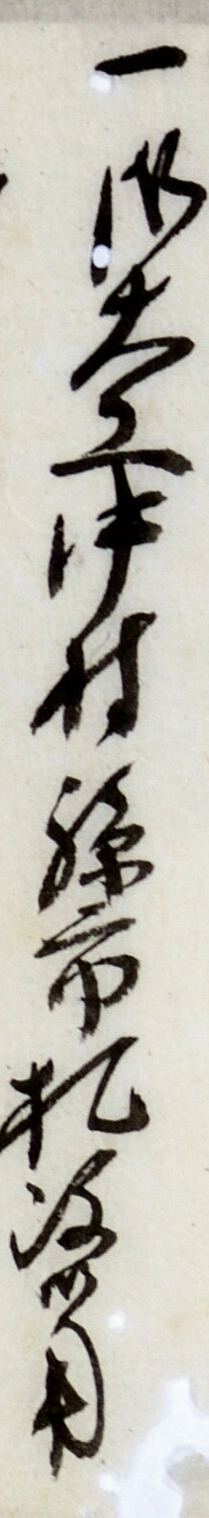一御大工中村孫市札改御用
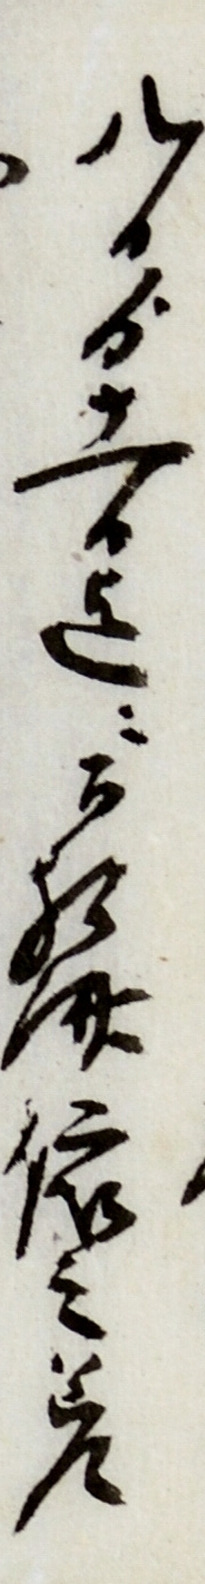八日より十一日迄にて相済依之差
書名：諸事御用留帳
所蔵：伊那市立高遠町図書館・合同会社AMANE
